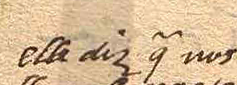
ella diz q̄ uos
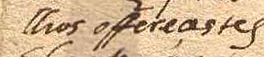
lhos offerecestes
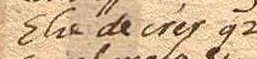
E he de crer q̄
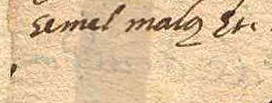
he mal malꝯ Etc.
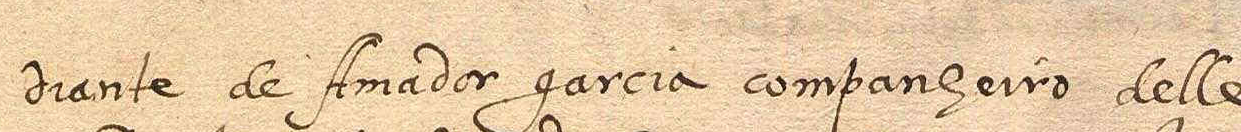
diante de Amador garcia companheiro delle
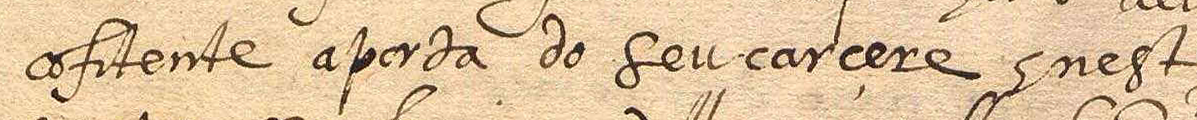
cōfitente a porta do seu carcere E neste
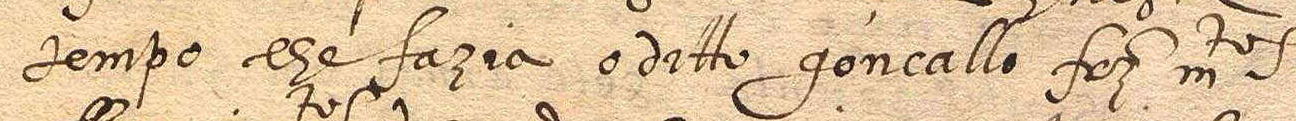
tempo lhe fazia o ditto gonçallo frz̄ mtos
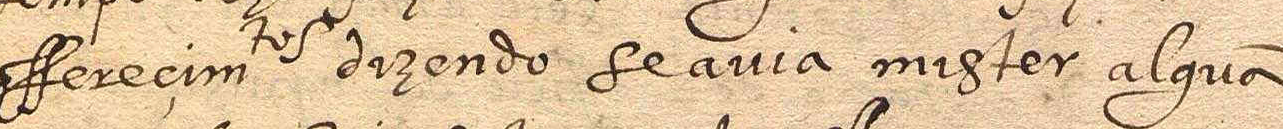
offerecimtos dizendo se auia mister alguā
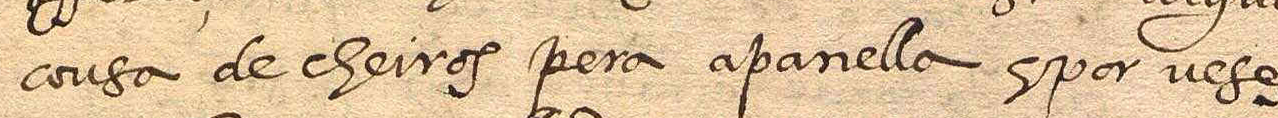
cousa de cheiros pera a panella E por ueses
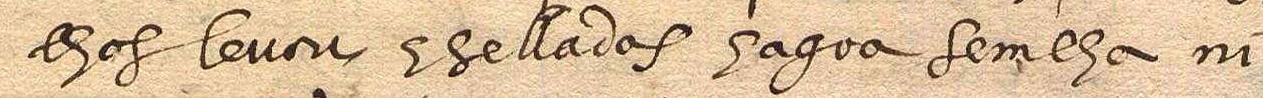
lhos leuou E selladas E agoa sem lha nī
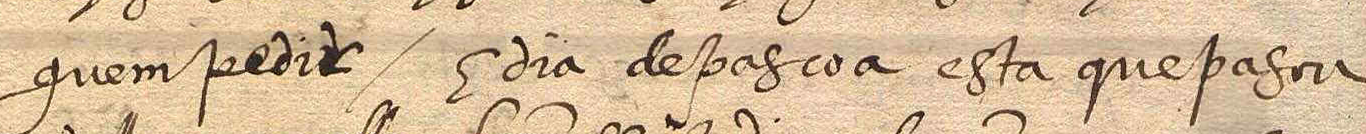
guem pedir / E dia de pascoa esta que pasou
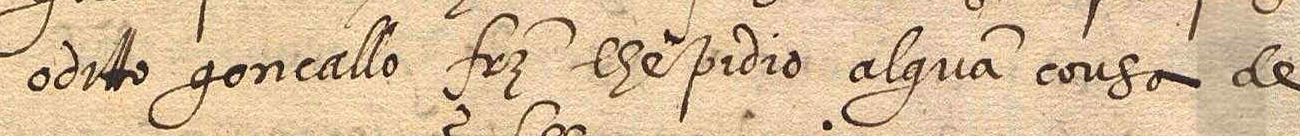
o ditto gonçallo frz̄ lhe pidio alguā cousa de
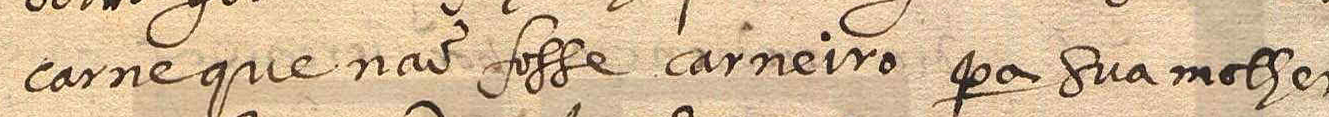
carne que naõ fosse carneiro ꝑa sua molher
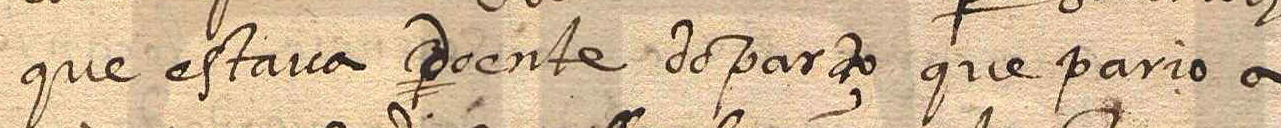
que estaua doente do parto que pario a
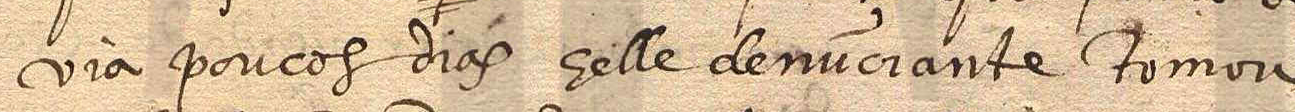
via poucos dias E elle denūciante tomou
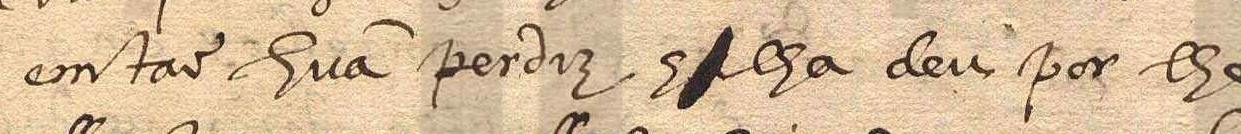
emtaõ huā perdiz E lha deu por lhe
